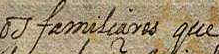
os familiares que
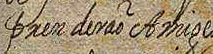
prenderaõ A migel
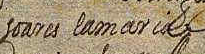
soares e a maria
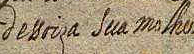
de ssoiza sua molher
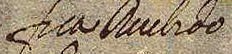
fica Recebido
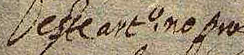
este arto. no pro
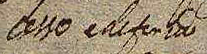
cesso e deferido
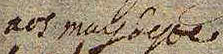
aos mais deste
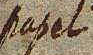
papel
